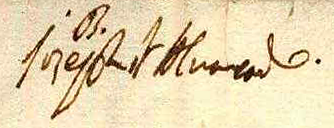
Iozeph d̄ Aluarado.
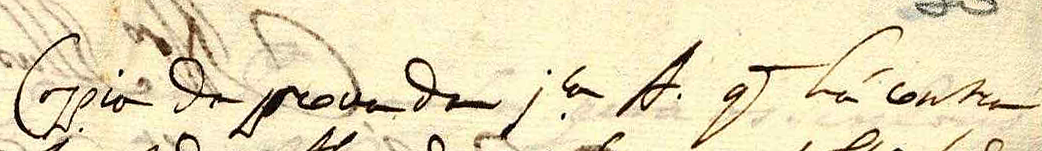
Copia da proua da j.ca A. q̄ há contra
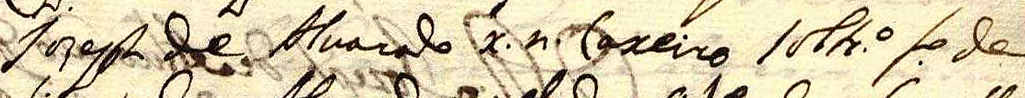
Iozeph de Aluarado x. n. Caxeiro soltr.o f.o de
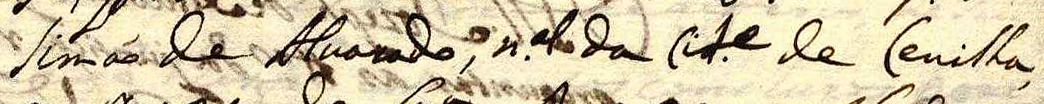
Simaõ de Aluarado, n.al da Cid̄.e de Ceuilha,
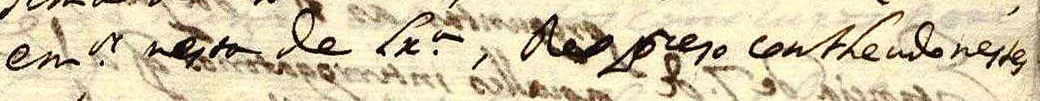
e m.or nesta de Lx.a, Reo prezo contheudo nestes
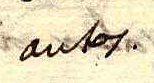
autos.
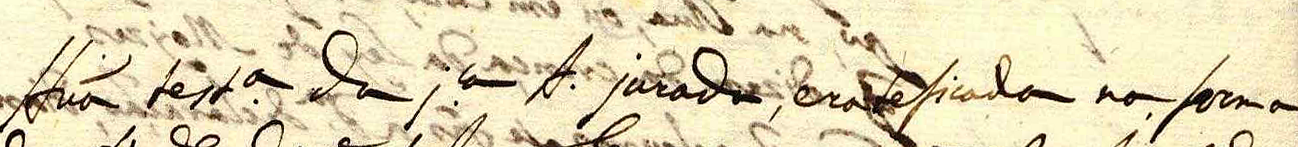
Huā test.a da j.ca A. jurada e rateficada na forma
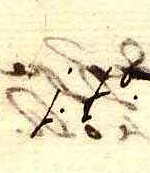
i. t.a
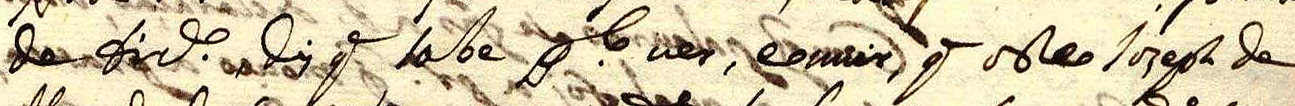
de Dir.to o dis q̄ sabe p.lo uer, e ouuir, q̄ o Reo Iozeph de
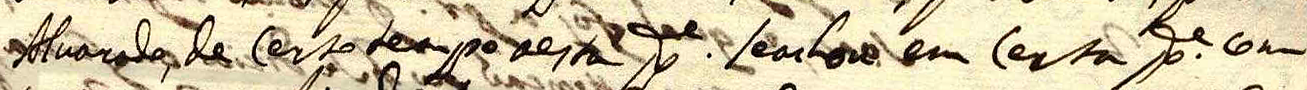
Aluarado, de certo tempo a esta pte. se achou em certa pte. com
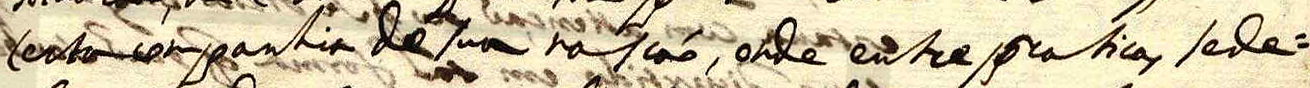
certa companhia de sua nasçaõ, onde entre praticas se de
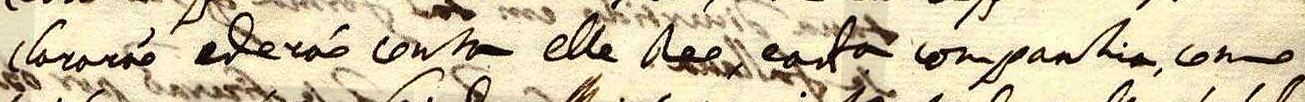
clararaõ e deraõ conta elle Reo, e a d̄a companhia, como
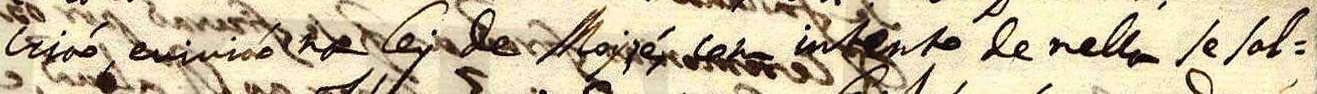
criaõ e uiuiaõ na ley de Moyzés com intento de nella se sal
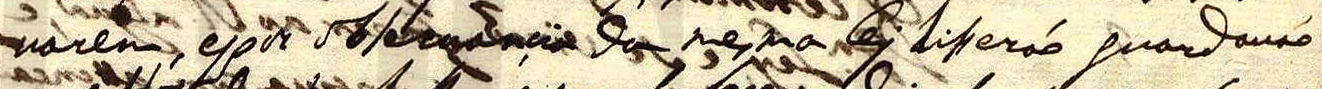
uarem, e por obseruancia da mesma ley disseraõ guardauaõ
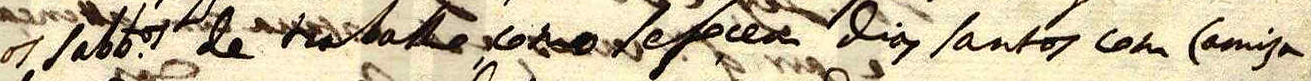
os sabb.os de trabalho, como se foçem dias santos com Camiza
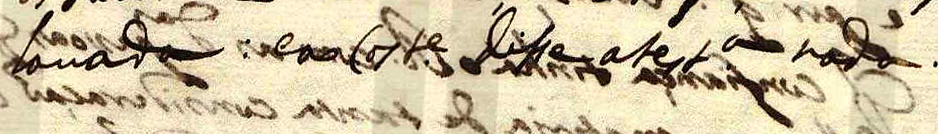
lauada: e ao Cost.e disse a test.a nada.
